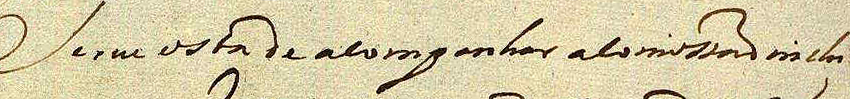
Serue esta de acompanhar a comissaõ inclu
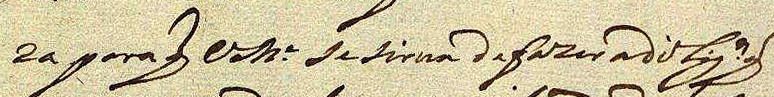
za para q̄ V M.e se sirua de fazer a dilig.a q̄
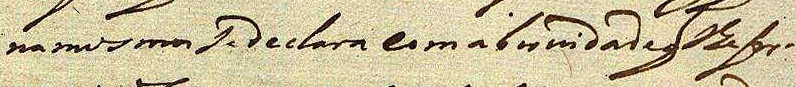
na mesma se declara com a beruidade q̄ lhe for
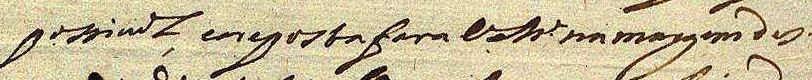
possiuel, e a reposta para V M.e em margem des
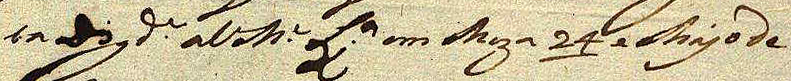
ta Ds gd.e a V M.e Lx.a em Meza 24 e Majo de
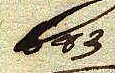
683
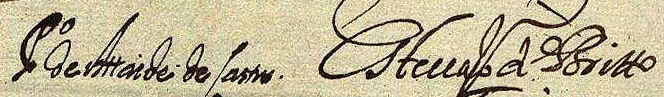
Po de Attaide de Castro. Esteuaõ de Britto
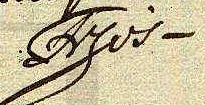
Foyos -
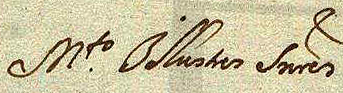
Mt.o Illustres Snrēs
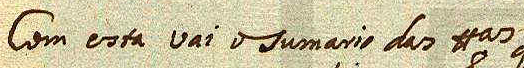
Com esta vai o sumario das ttas
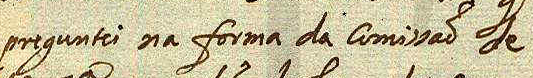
preguntei na forma da comissaõ de
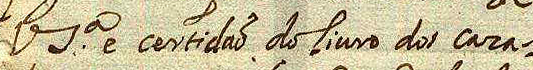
V S.a e certidaõ do liuro dos caza
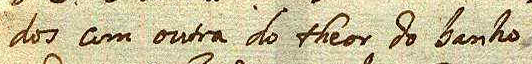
dos com outra do theor do banho
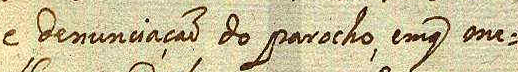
e denunciaçaõ do parocho, em q̄ me
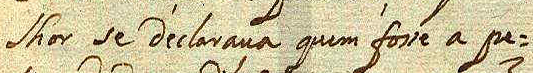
lhor se declaraua quem fosse a pe
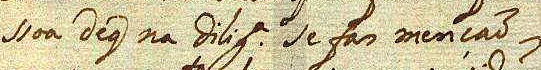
ssoa de q̄ na dilig.a se faz mençaõ
